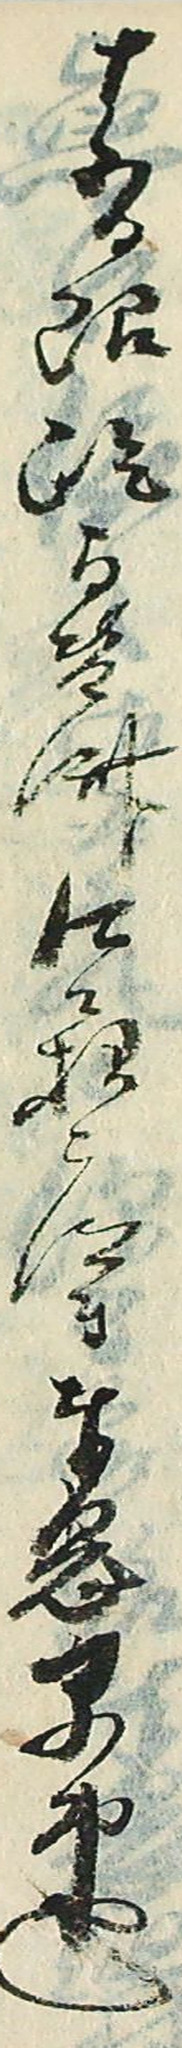十五日限屹と皆済仕候様被仰付奉畏早速
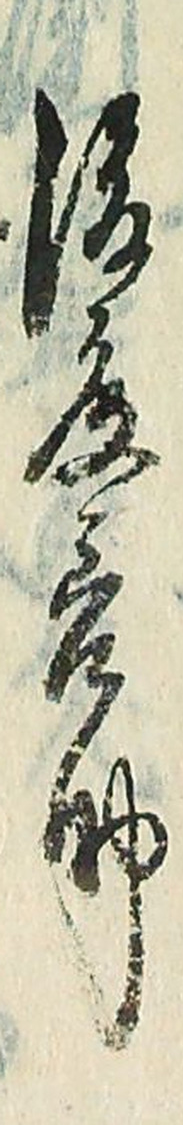後藤善助
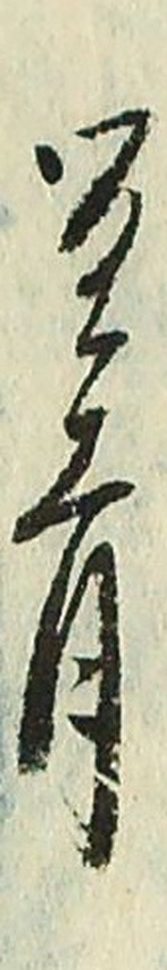閏十一月
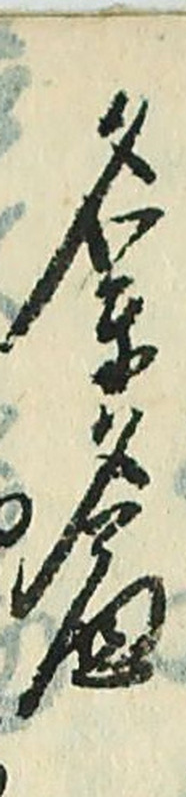名東名西
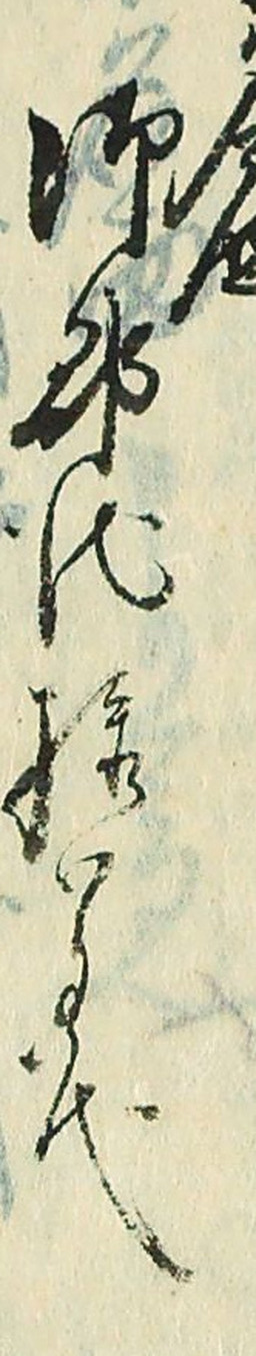御郡代様御手代
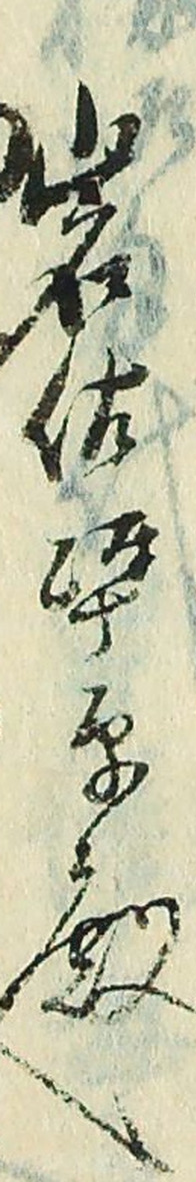岩佐準平殿
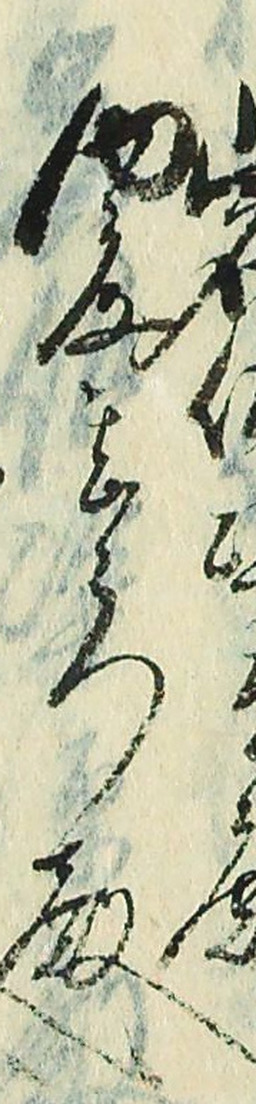内藤甚右衛門殿
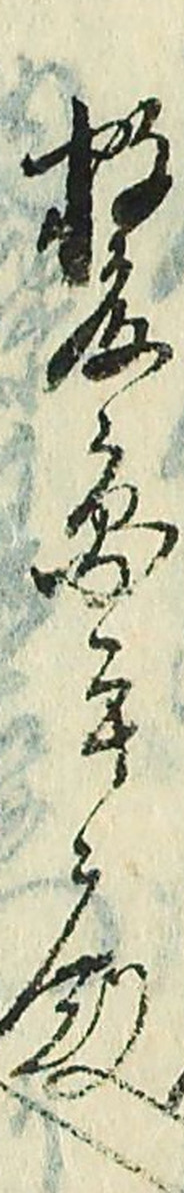数藤円平殿
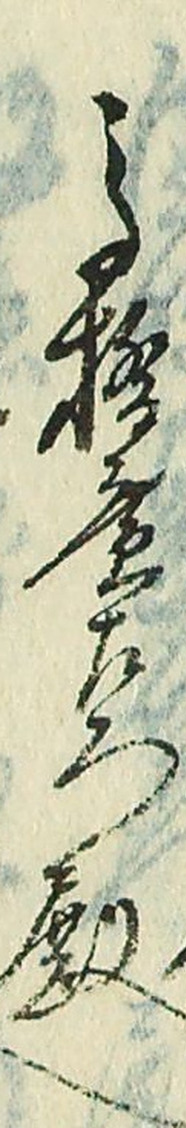高橋広左衛門殿
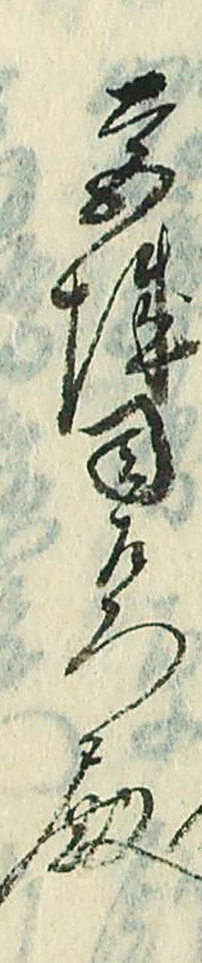宮城周左衛門殿

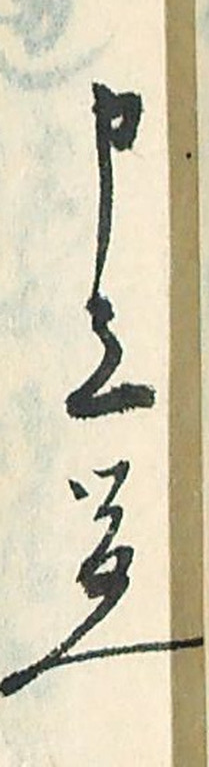申上覚
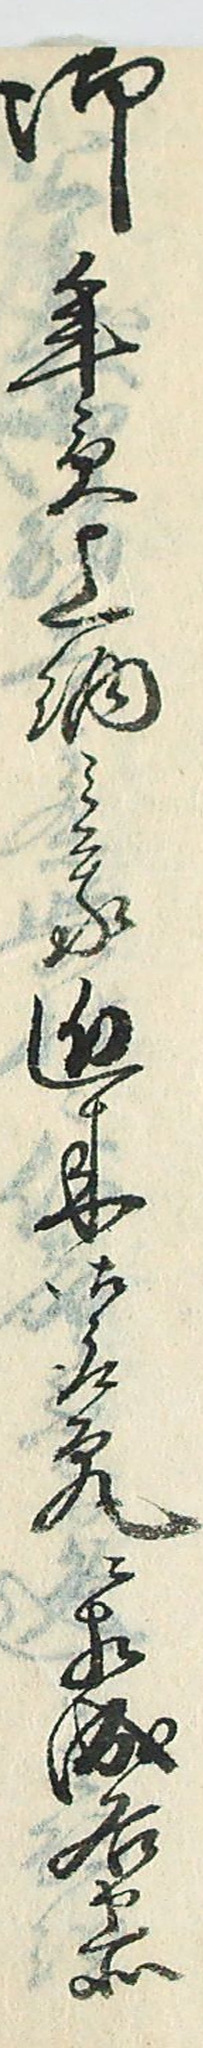御年貢上納之義近来御取究に相成居申所
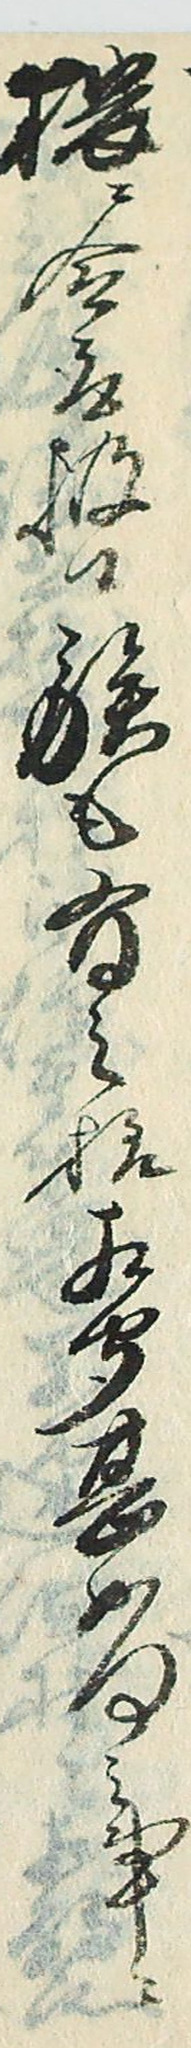猥に令取扱候族も有之様相聞甚如何之事に
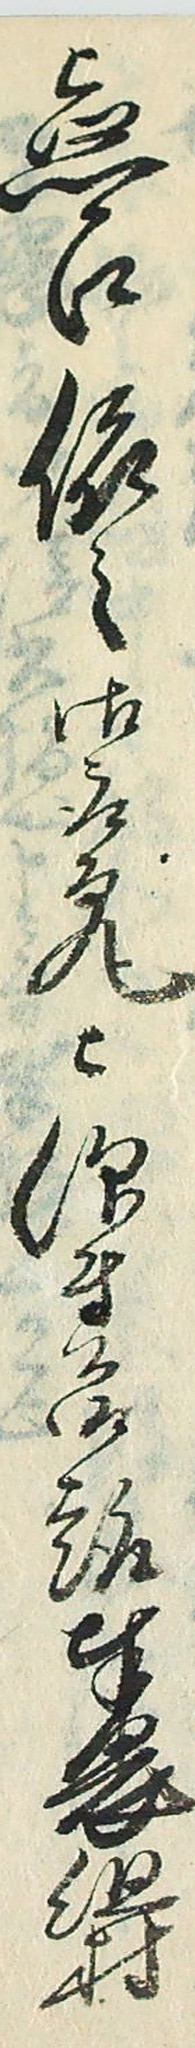被思召依之御取究被仰付候御趣奉畏組村
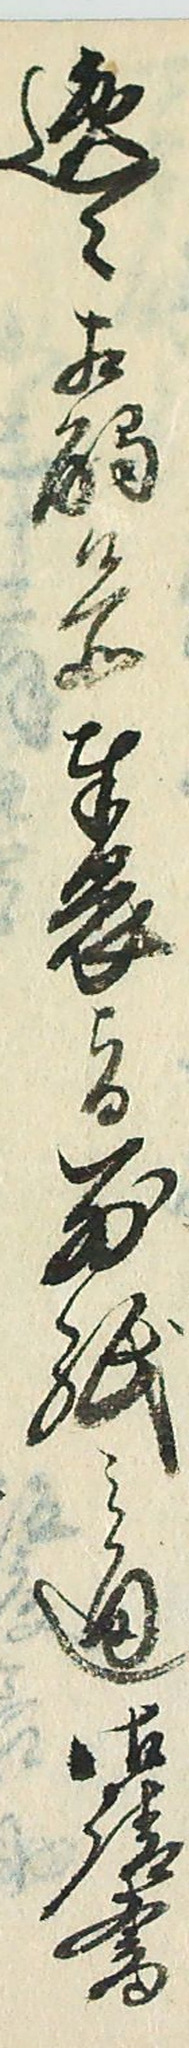逸々相触候所奉畏旨別紙之通御請書
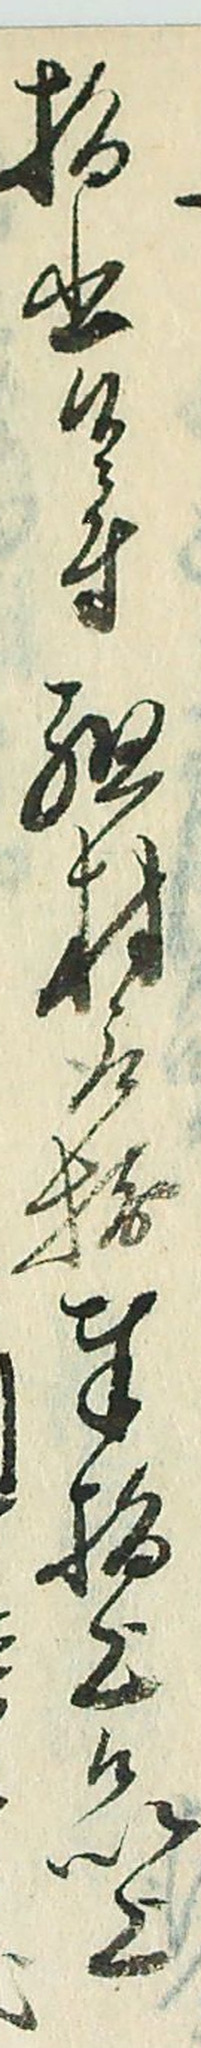指出候に付組村取揃奉指上候以上
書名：諸御用御□受書控
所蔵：鳴門教育大学 Naruto University of Education
